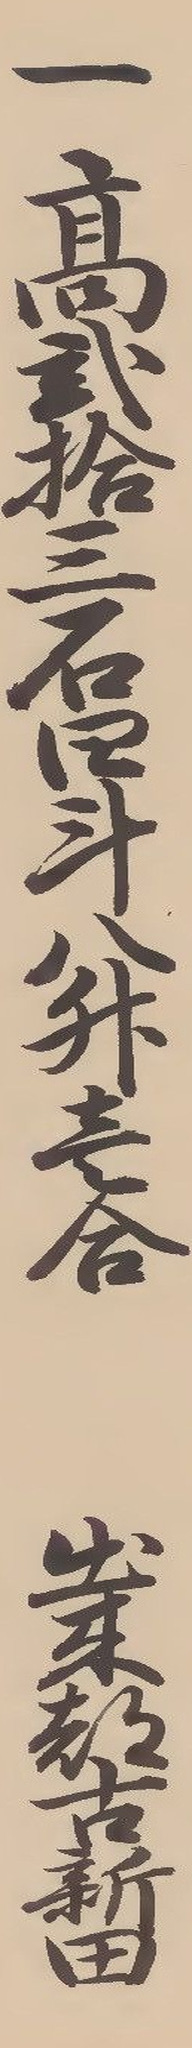一高弐拾三石四斗八升壱合出来都古新田
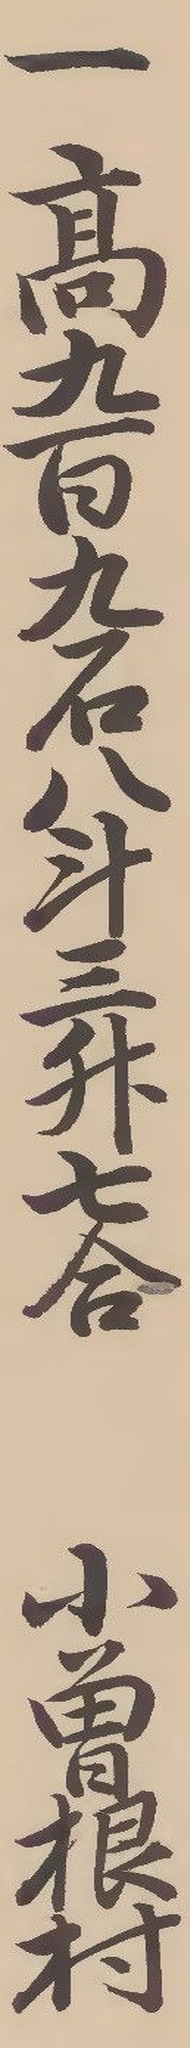一高九百九石八斗三升七合小曽根村

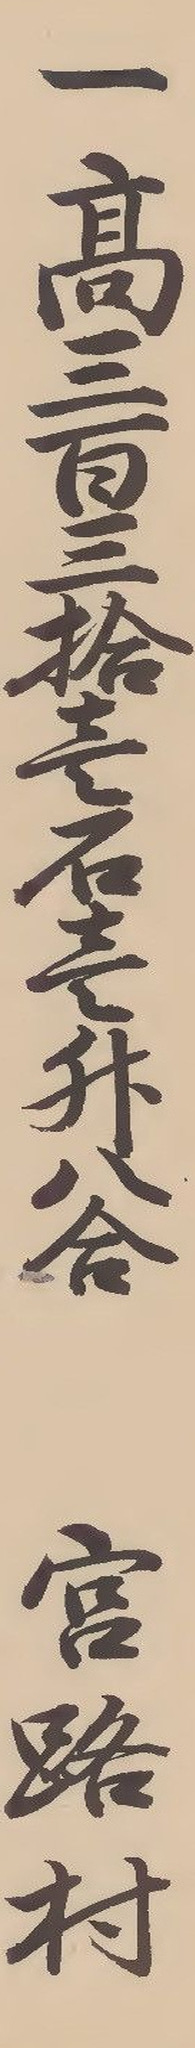一高三百三拾壱石壱升八合宮路村
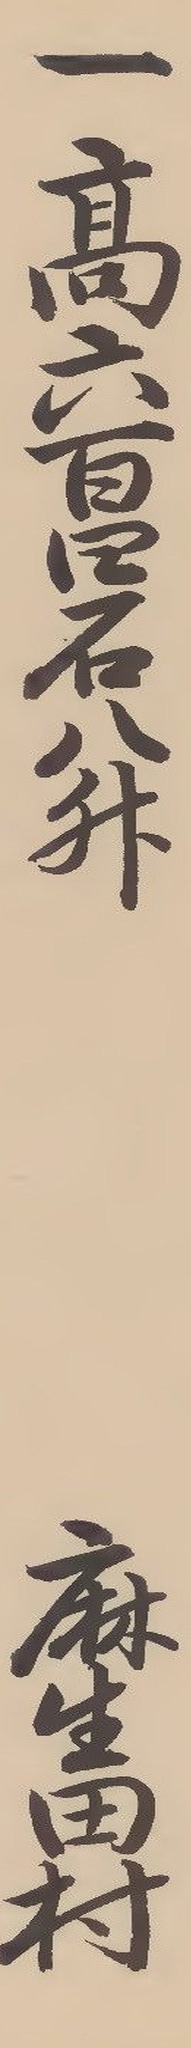一高六百四石八升麻生田村
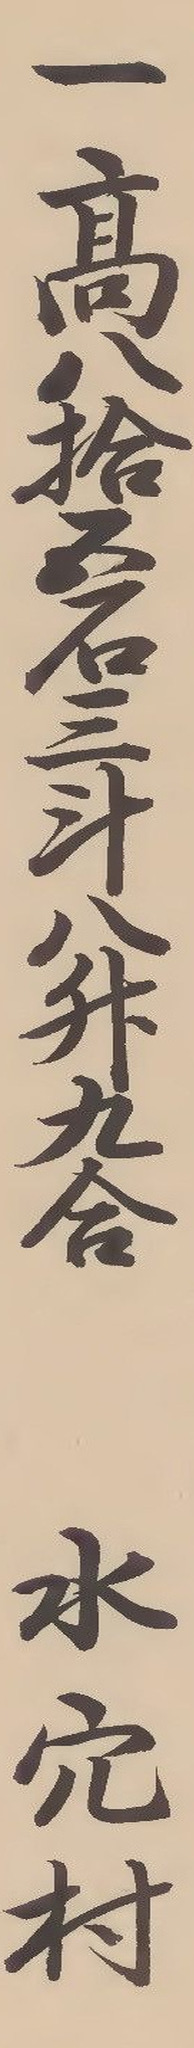一高八拾五石三斗八升九合水穴村
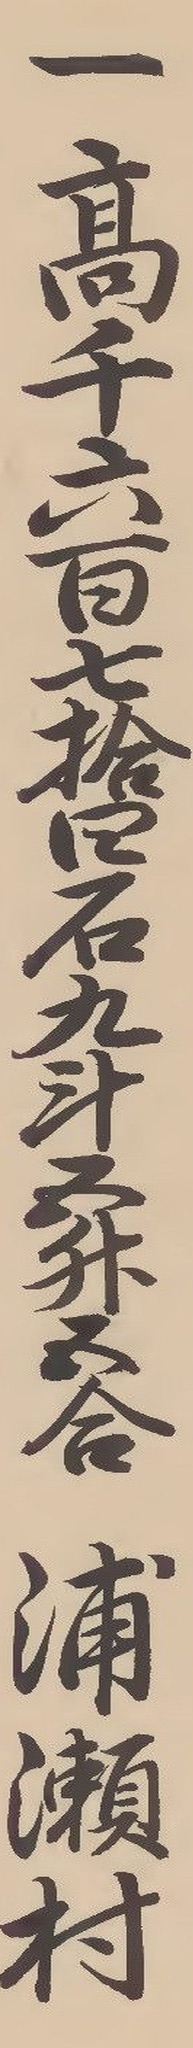一高千六百七拾四石九斗五升五合浦瀬村
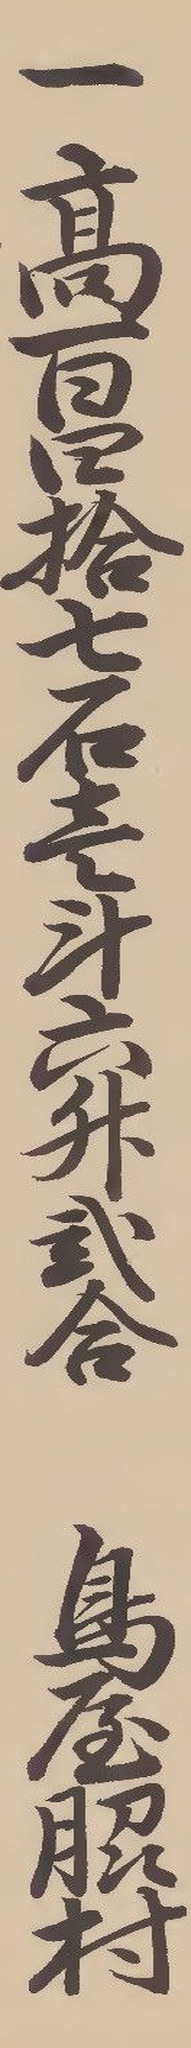一高百四拾七石壱斗六升弐合鳥屋脇村
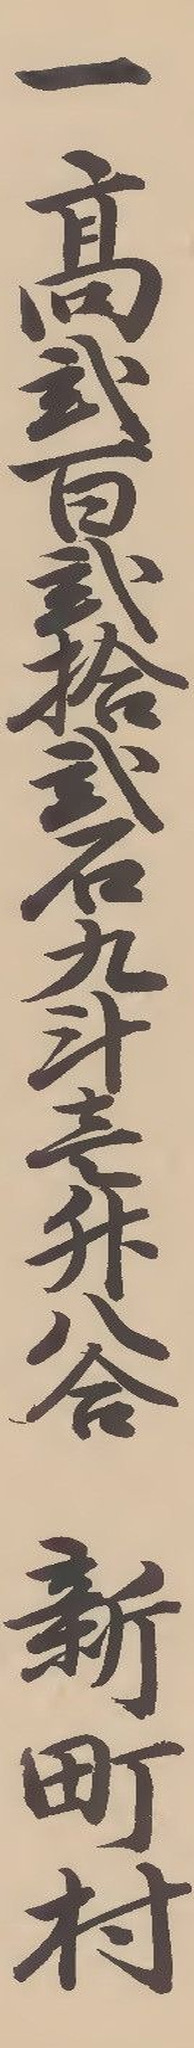一高弐百弐拾弐石九斗壱升八合新町村
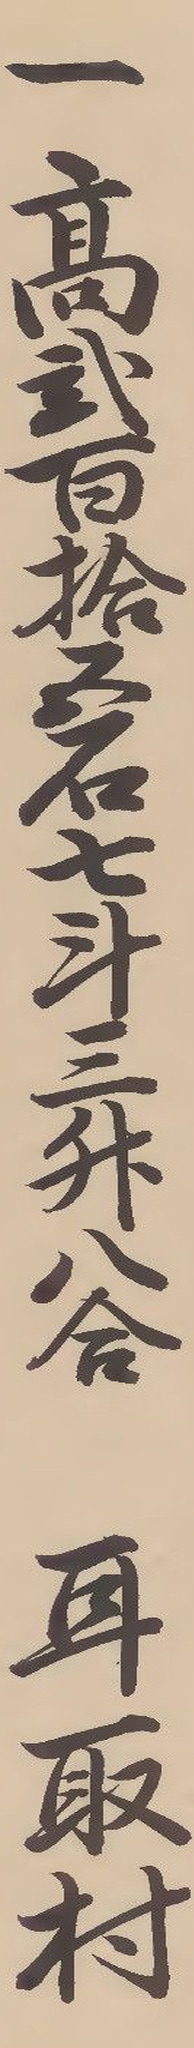一高弐百拾五石七斗三升八合耳取村
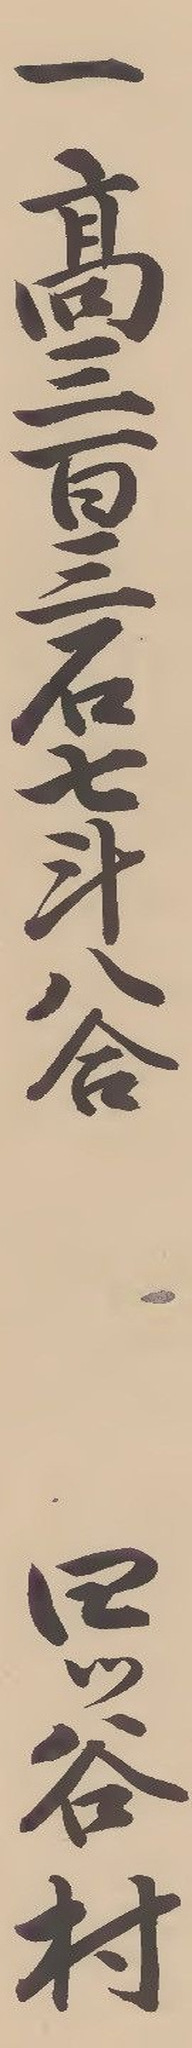一高三百三石七斗八合四ッ谷村

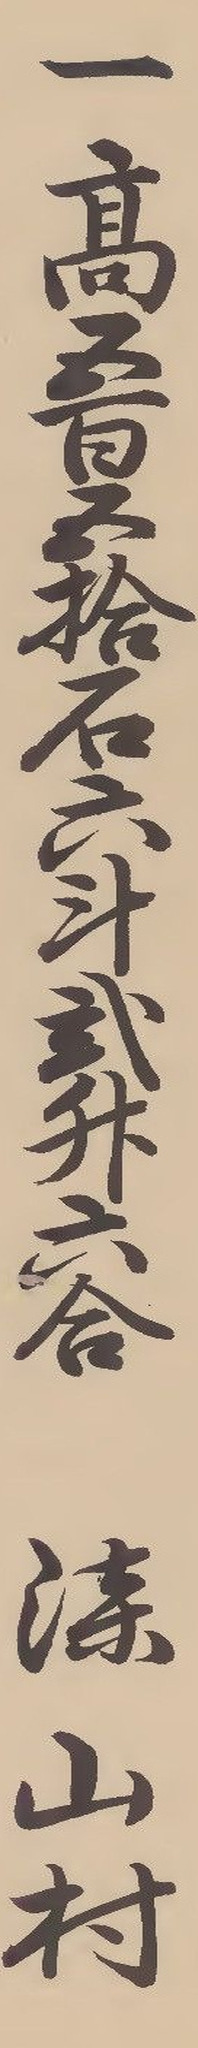一高五百五拾石六斗弐升六合漆山村
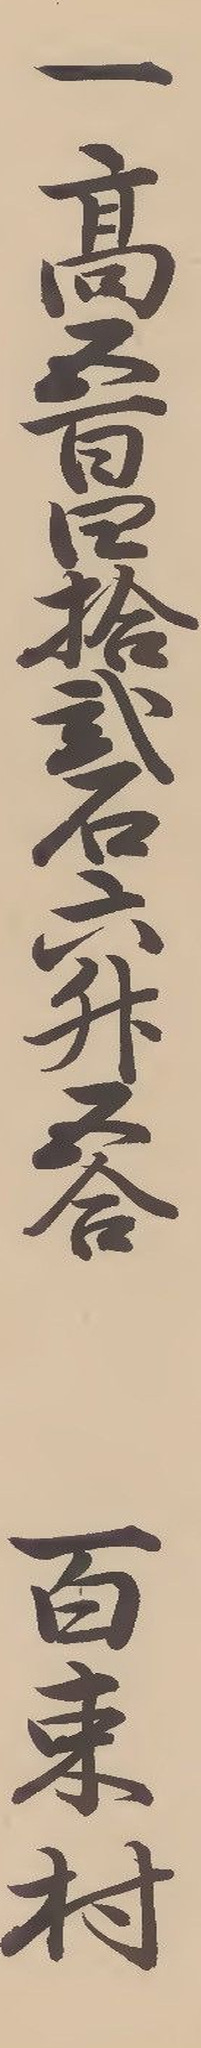一高五百四拾弐石六升五合百束村
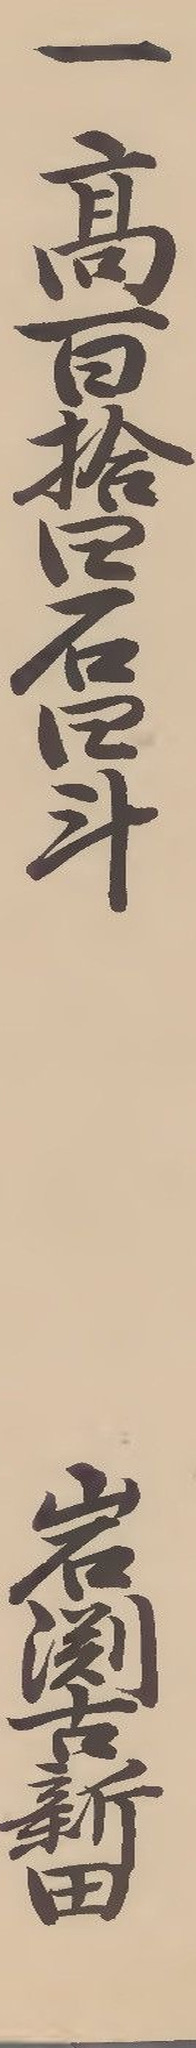一高百拾四石四斗岩淵古新田
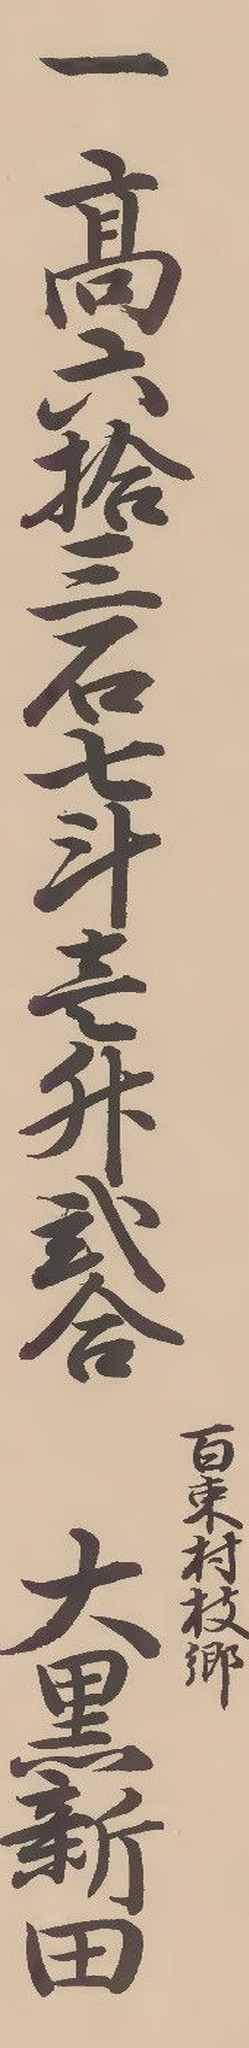一高六拾三石七斗壱升弐合大黒新田
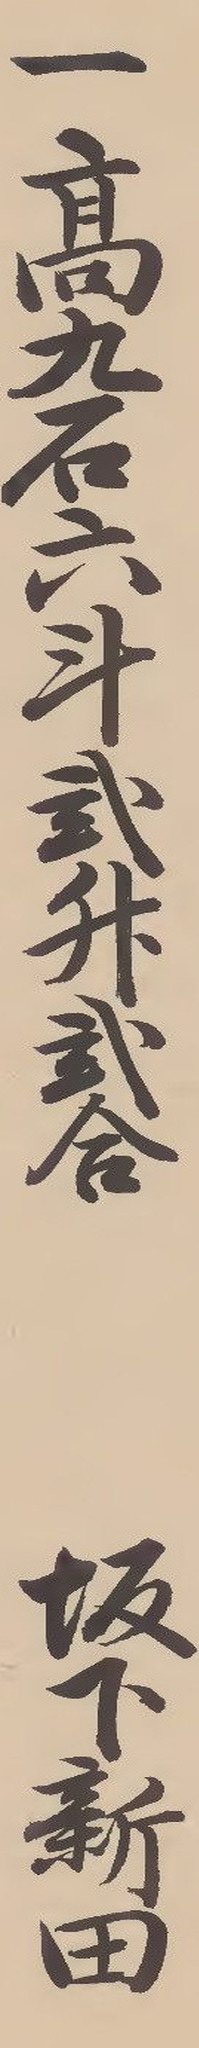一高九石六斗弐升弐合坂下新田
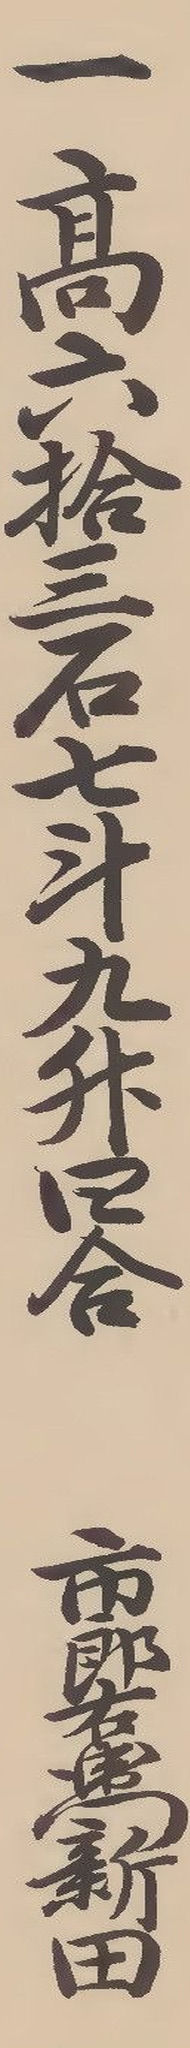一高六拾三石七斗九升四合市郎右衛門新田
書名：越後国郷帳　中
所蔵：国立公文書館 National Archives of Japan
